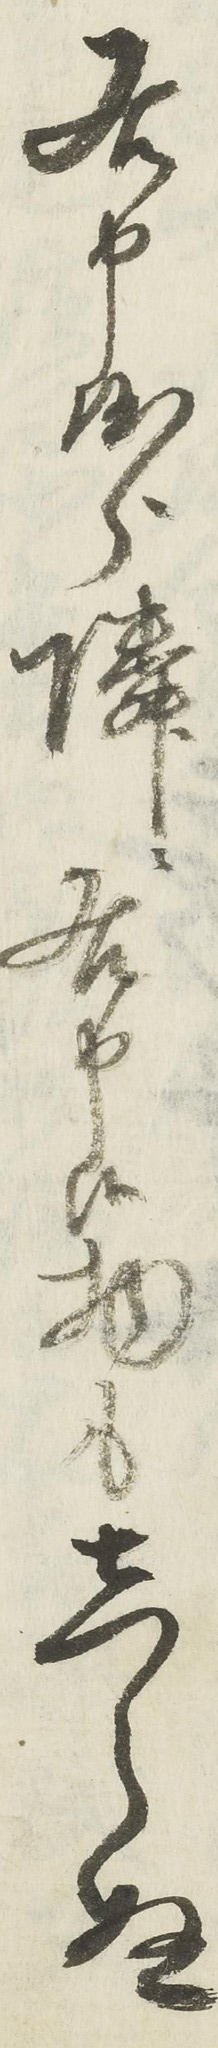居申やら隣ニ居申候物もしらぬ
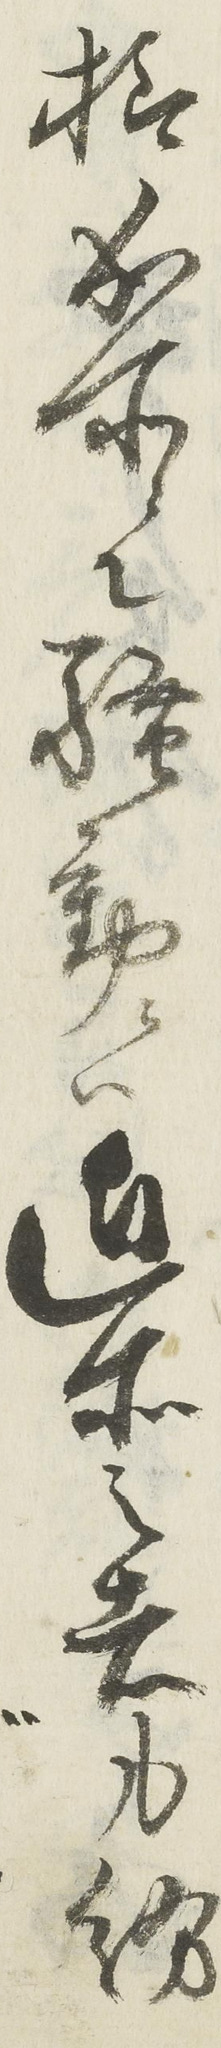様成所ニて騒動ニは近所之者も紛
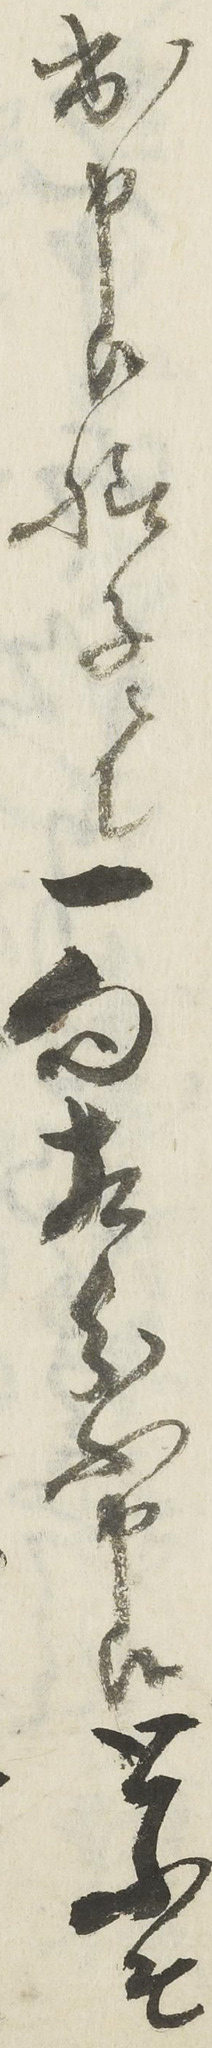出申候様子ニて一向相分不申候どふそ
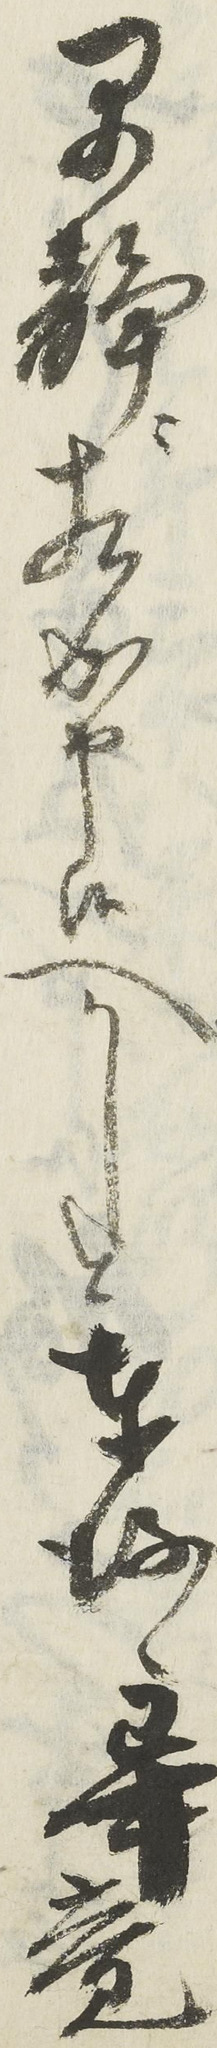早静ニ相成申候へかしと奉存候畢竟
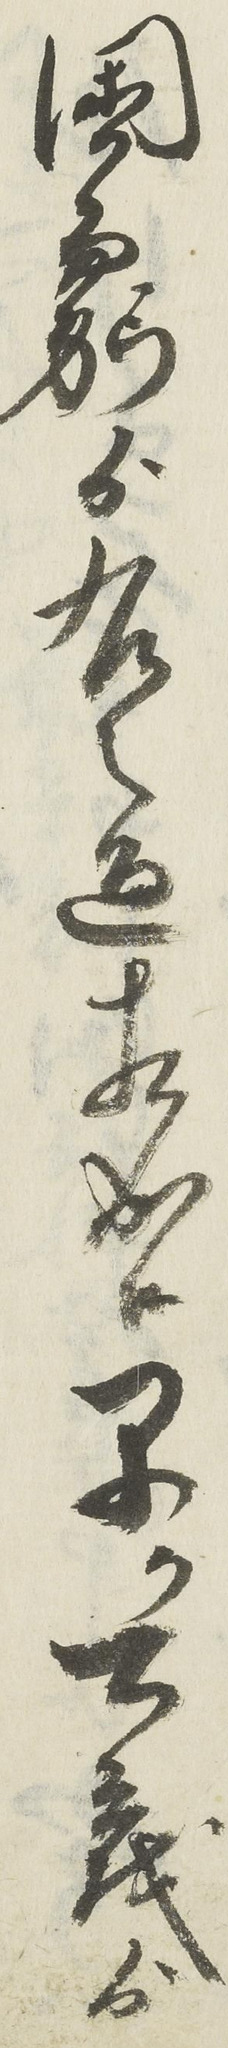困窮ゟ右之通相成候早ク公義ゟ
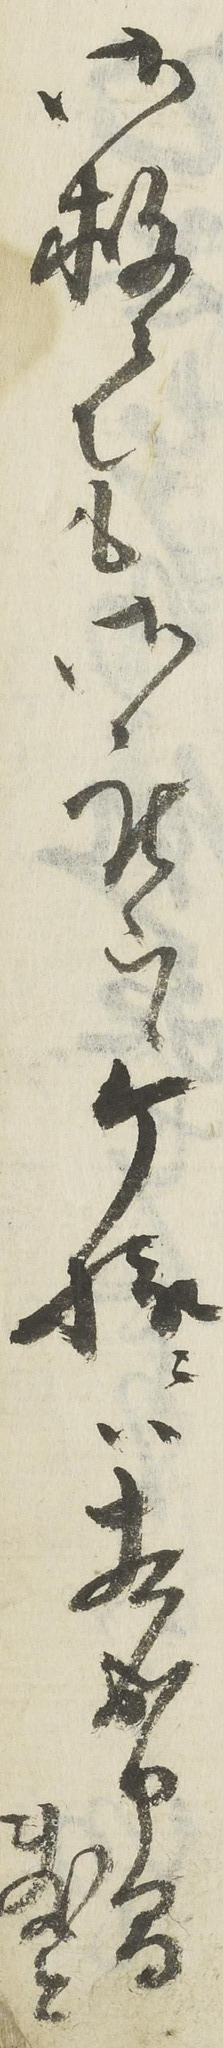御救ニても御座候はヽケ様ニは成申間敷と

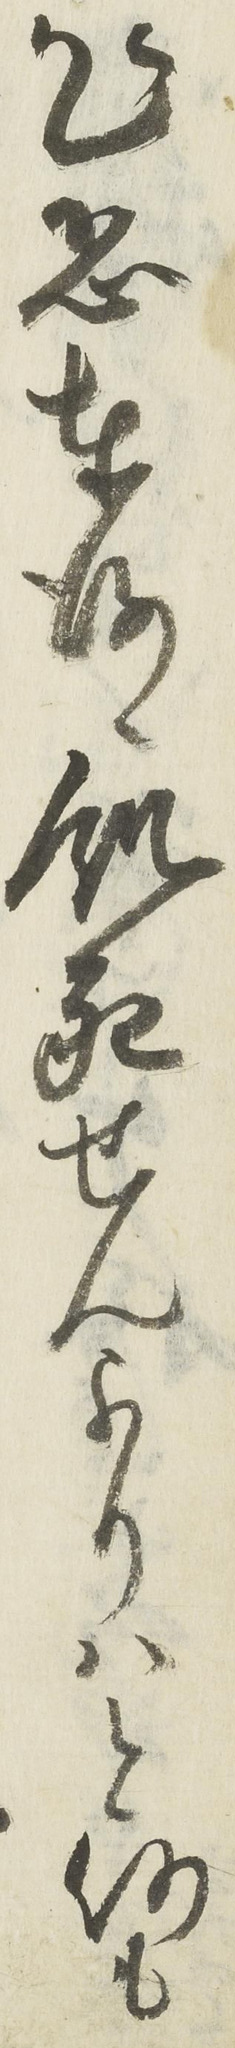乍恐奉存候飢死せんよりはと何も
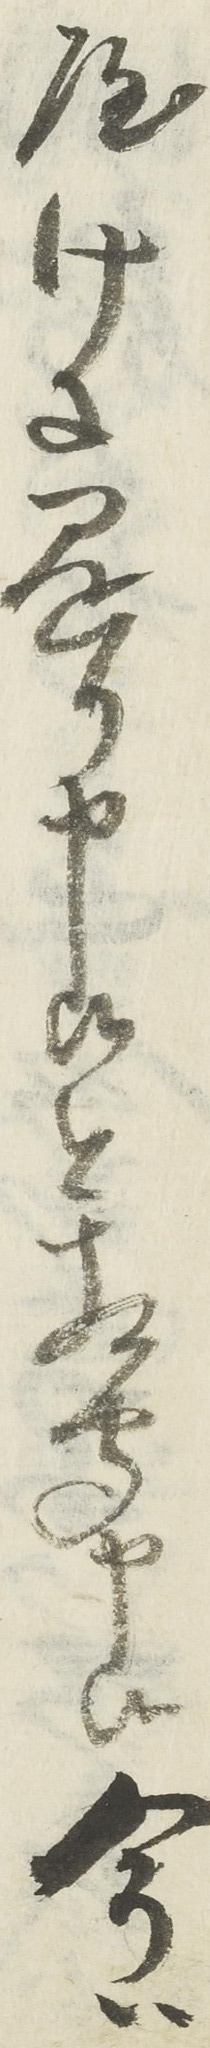やけに懸り申候と相聞申候今は
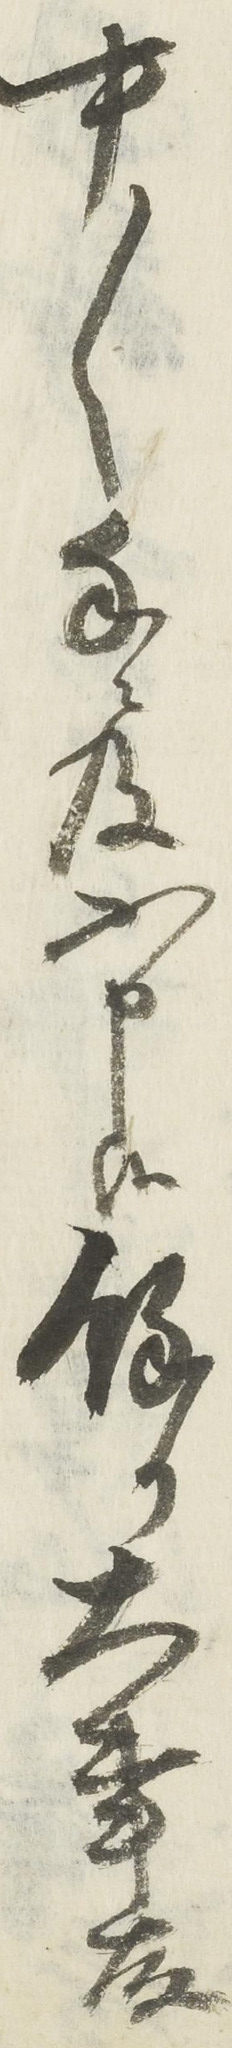中〳〵手ニ及不申候余り大事故
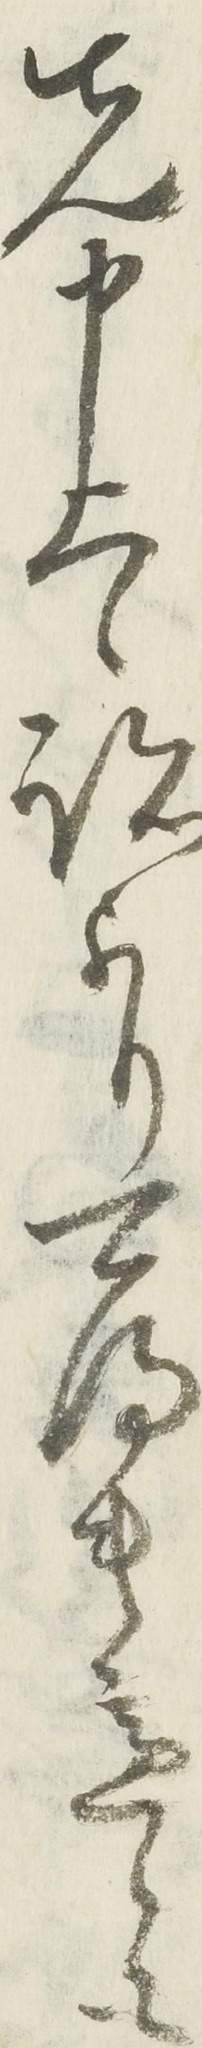先申上候跡より可得貴意候以上
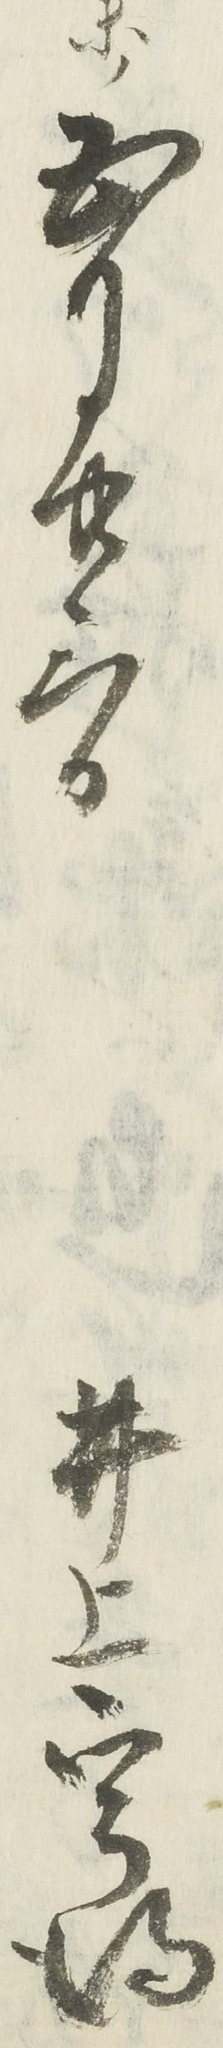五月廿三日井上宇得
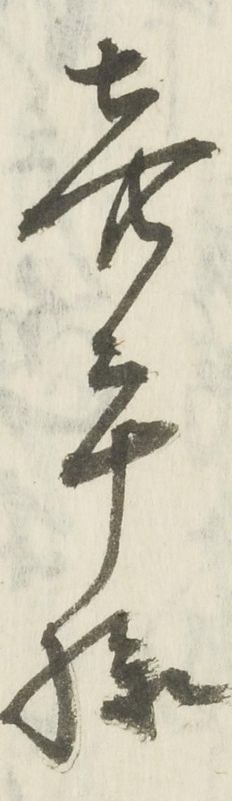喜平様
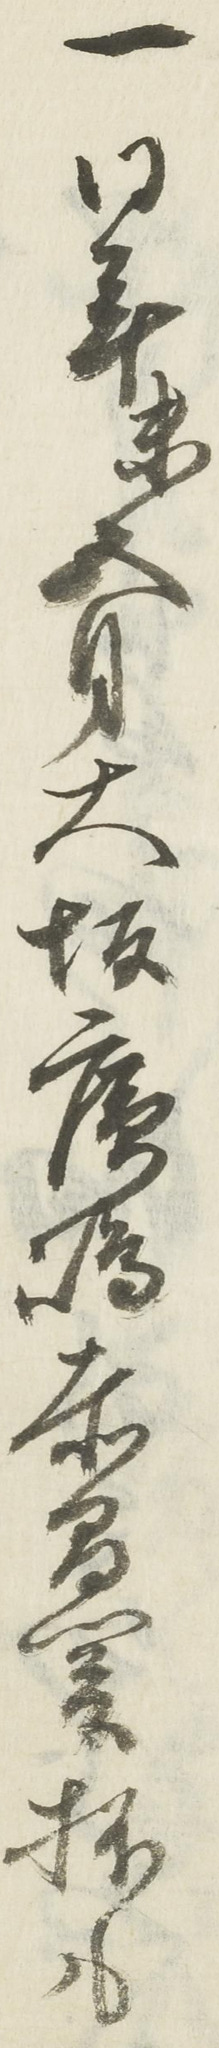一同年未五月大坂廣嶋赤間関抔も
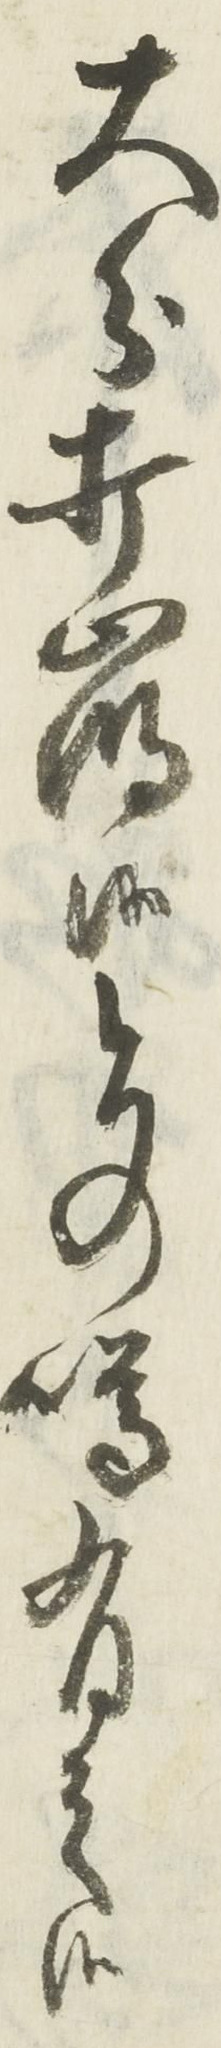大分打崩候との噂有之候
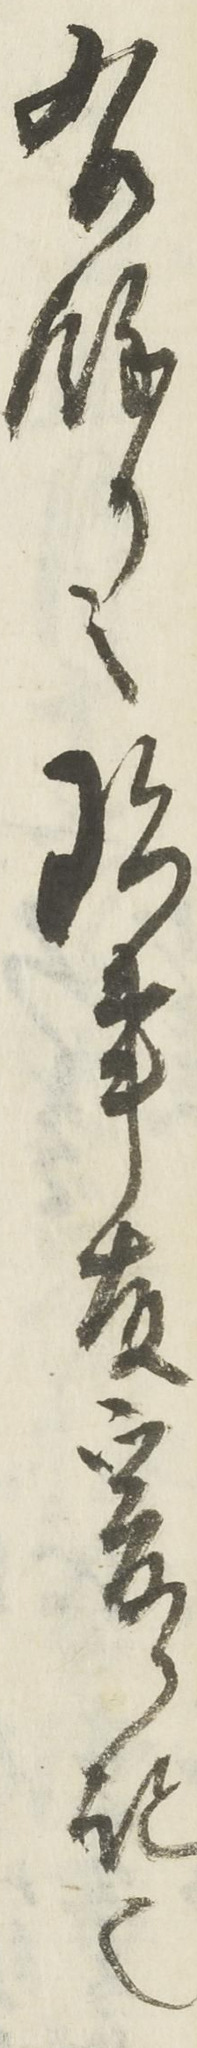右余り之珍事故爰ニ記也
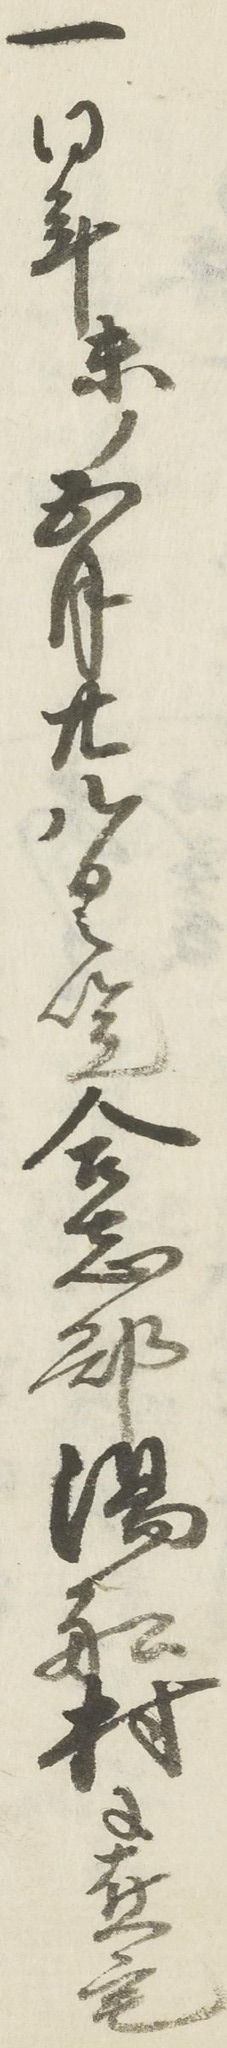一同年未ノ五月廿八日晩合志郡湯船村に在宅
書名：後見笑
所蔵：東京大学地震研究所図書室 Earthquake Research Institute Library, The University of Tokyo, JAPAN
